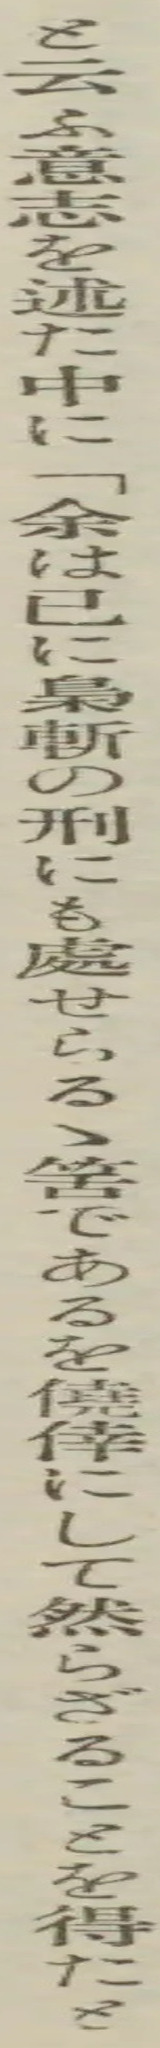と云ふ意志を述た中に「余は已に梟斬の刑にも処せらるゝ筈であるを僥倖にして然らざることを得たと
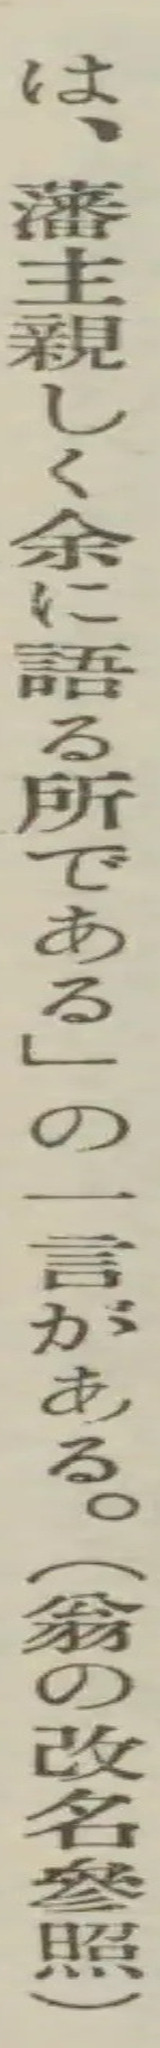は、藩主親しく余に語る所である」の一言がある。(翁の改名参照)
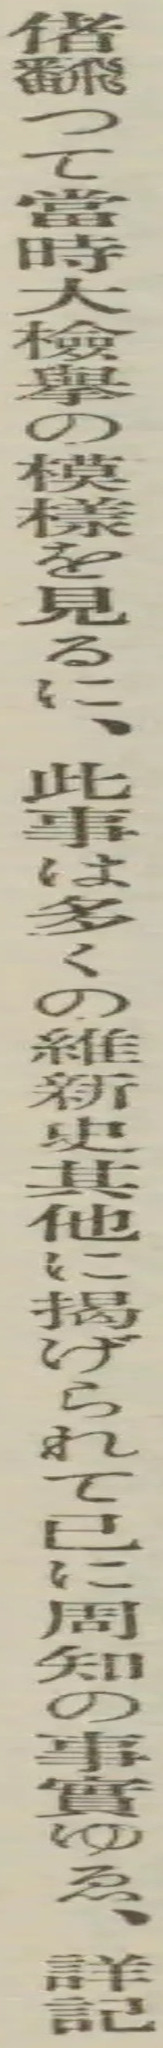偖翻つて当時大検挙の模様を見るに、此事は多くの維新史其他に掲げられて已に周知の事実ゆゑ、詳記
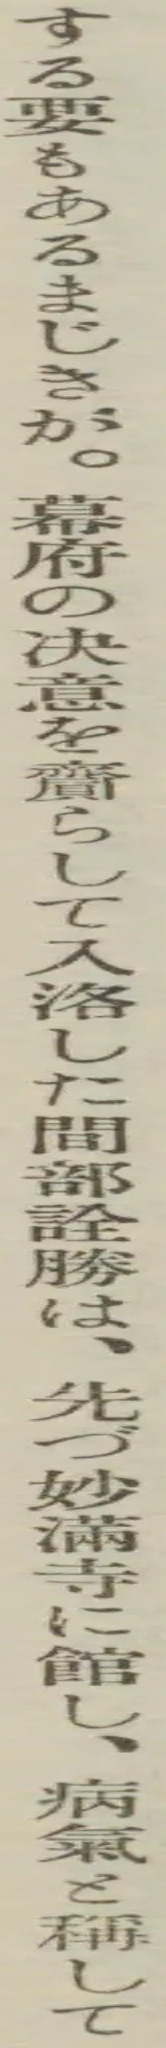する要もあるまじきが。幕府の決意を齎らして入洛した間部詮勝は、先づ妙満寺に館し、病気と称して
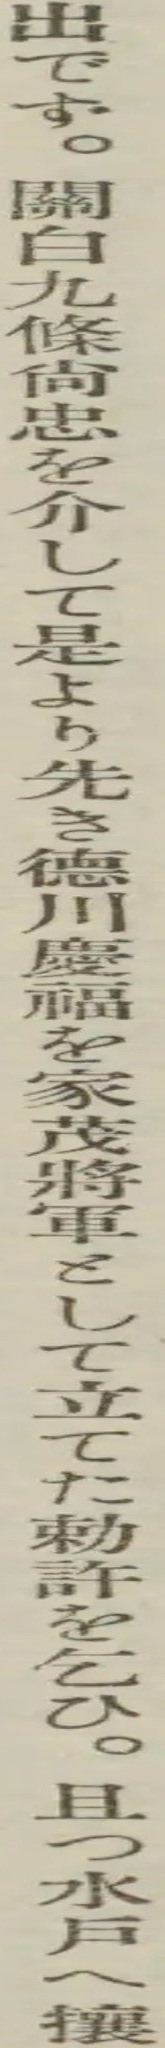出でず。関白九條尚忠を介して是より先き徳川慶福を家茂将軍として立てた勅許を乞ひ。且つ水戸へ攘
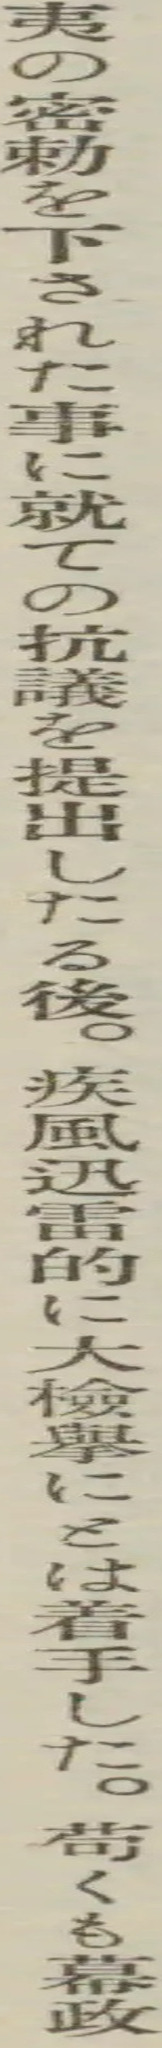夷の密勅を下された事に就ての抗議を提出したる後。疾風迅雷的に大検挙にとは着手した。苟くも幕政
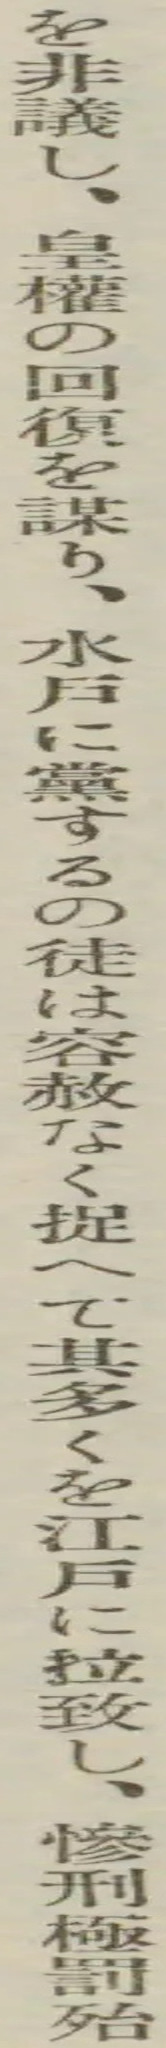を非議し、皇権の回復を謀り、水戸に党するの徒は容赦なく捉へて其多くを江戸に拉致し、惨刑極罰殆
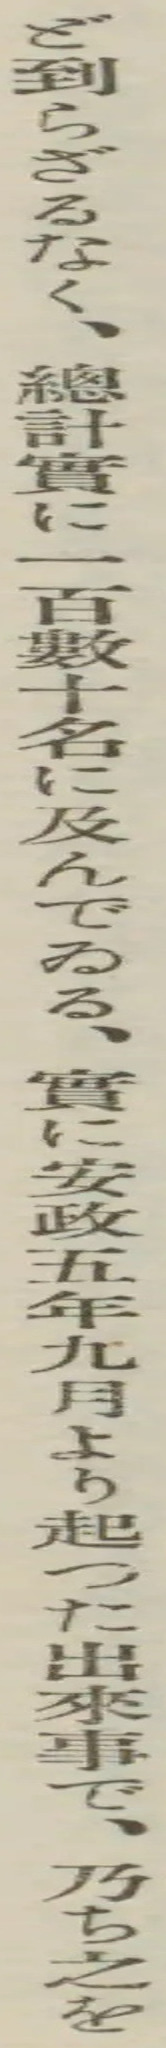と到らざるなく、総計実に一百数十名に及んでゐる、実に安政五年九月より起つた出来事で、乃ち之を
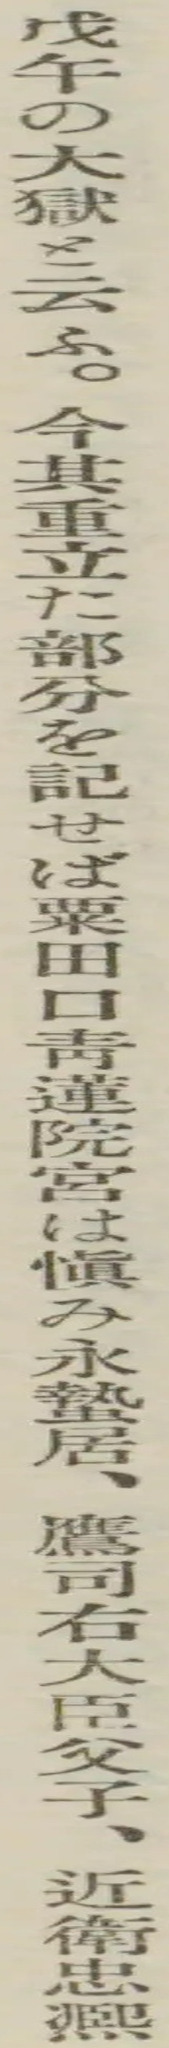戊午の大獄と云ふ。今其重立た部分を記せば粟田口青蓮院宮は慎み永蟄居、鷹司右大臣父子、近衛忠凞
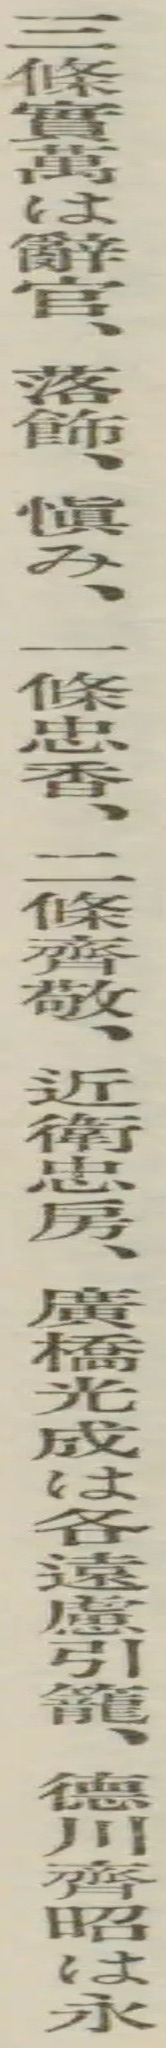三條實萬は辞官、落飾、慎み、一條忠香、二條齊敬、近衛忠房、廣橋光成は各遠慮引籠、徳川齊昭は永
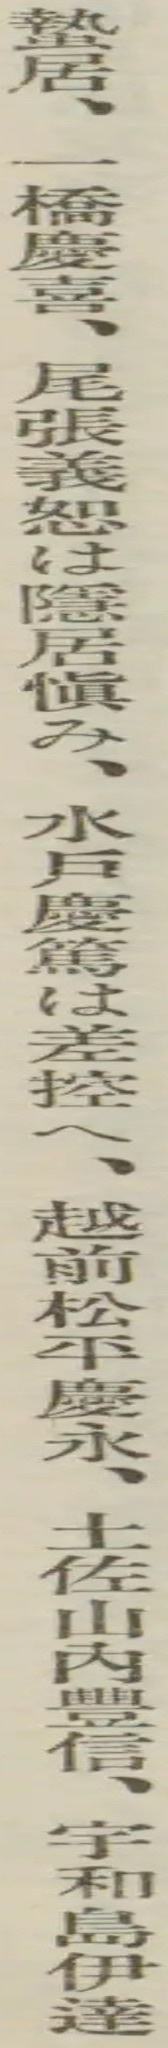蟄居、一橋慶喜、尾張義恕は隠居慎み、水戸慶篤は差控へ、越前松平慶永、土佐山内豐信、宇和島伊達
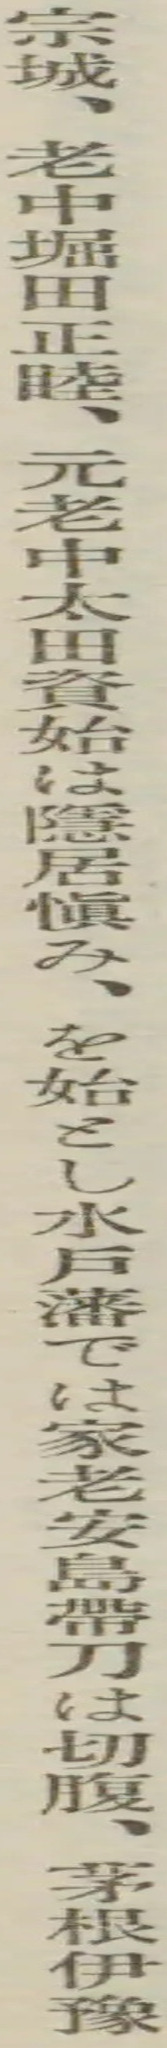宗城、老中堀田正睦、元老中太田資始は隠居慎み、を始とし水戸藩では家老安島帯刀は切腹、茅根伊豫
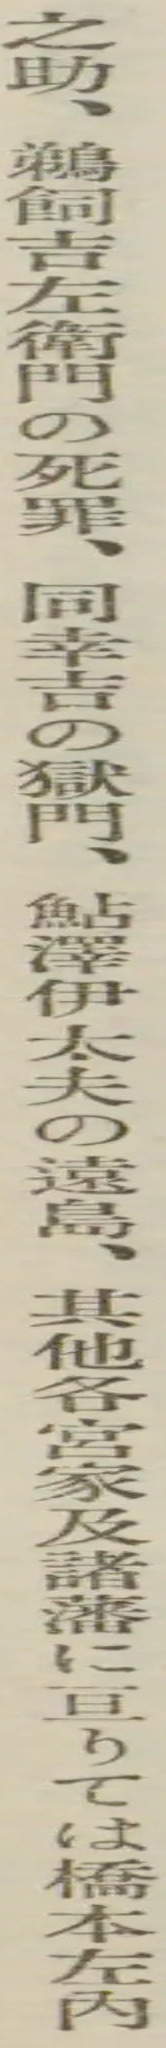之助、鵜飼吉左衛門の死罪、同幸吉の獄門、鮎澤伊太夫の遠島、其他各宮家及諸藩に亘りては橋本左内
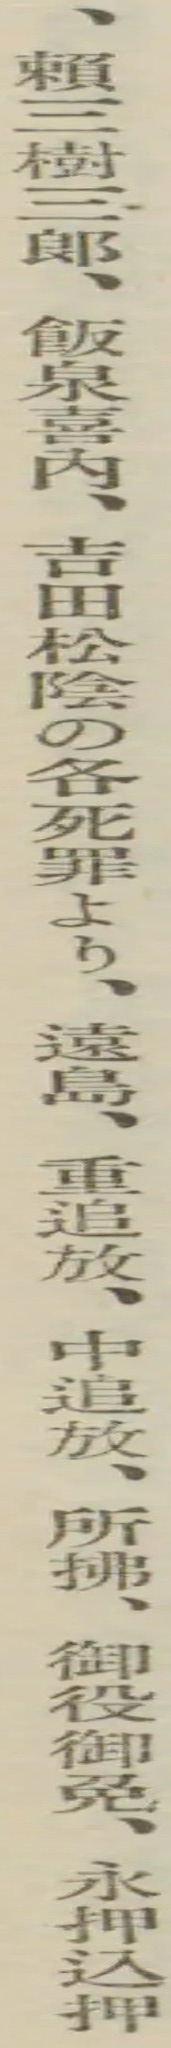、賴三樹三郎、飯泉喜内、吉田松陰の各死罪より、遠島、重追放、中追放、所払、御役御免、永押込押

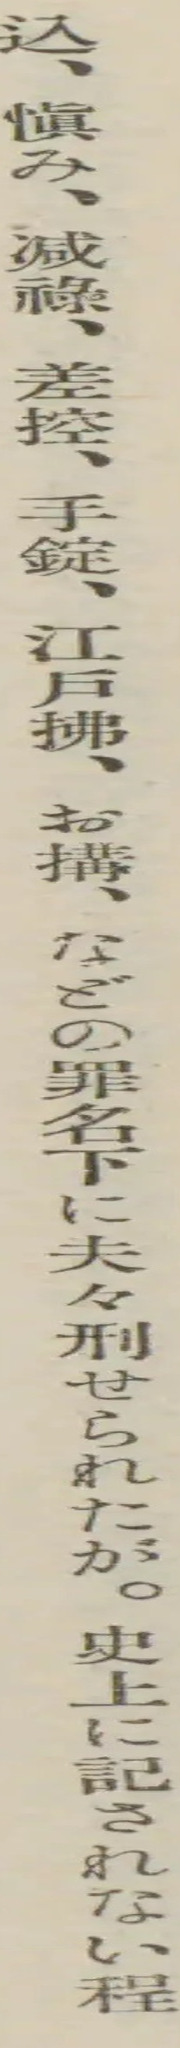込、慎み、減禄、差控、手錠、江戸払、お搆、などの罪名下に夫々刑せられたが。史上に記されない程
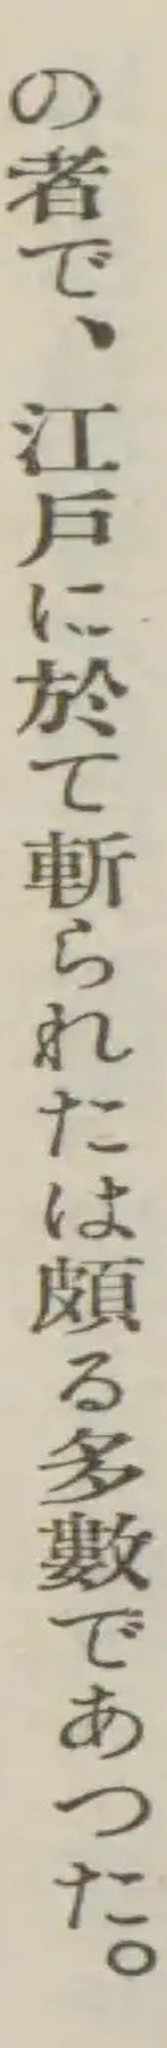の者で、江戸に於て斬られたは頗る多数であつた。
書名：小野湖山翁小伝
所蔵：国立国会図書館 National Diet Library, JAPAN
